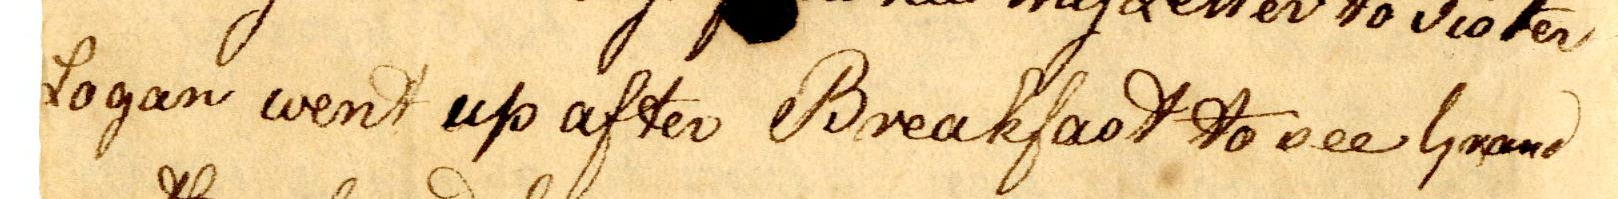Logan went up after Breakfast to see Grand
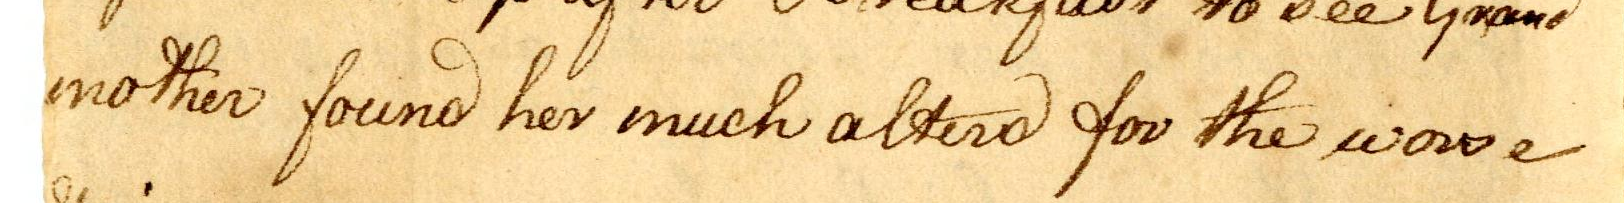mother found her much alterd for the worse
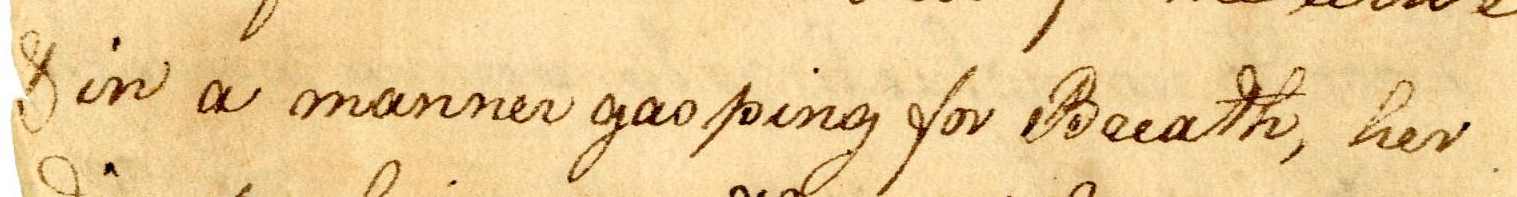& in a manner gasping for Breath, her
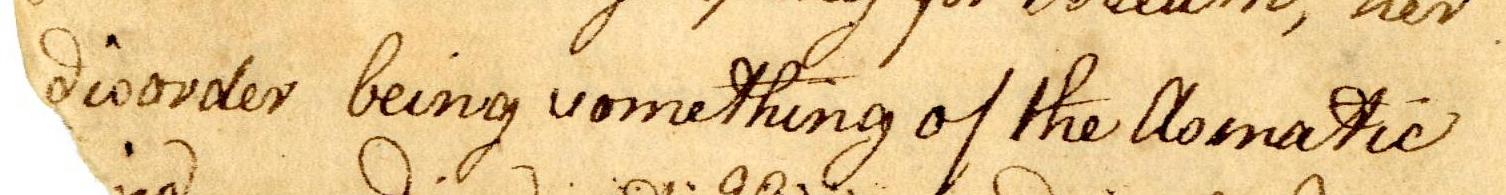disorder being something of the Asmatic
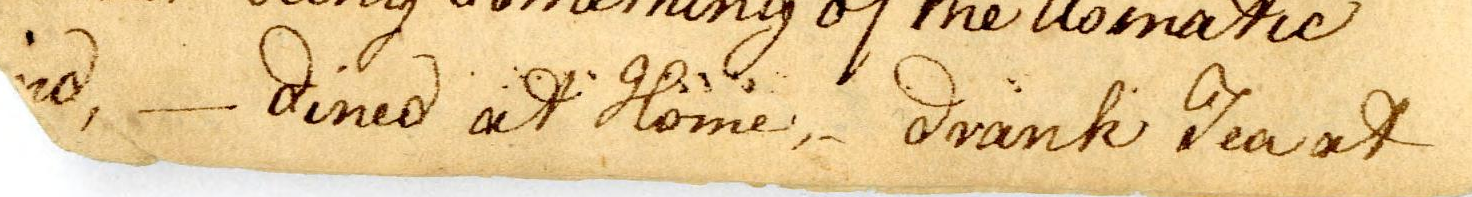nd,- dined at Home,- drank Tea at
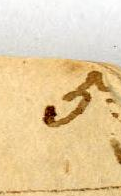5
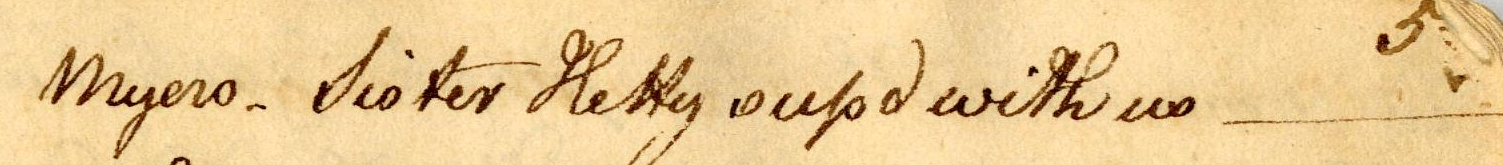Myers. Sister Hetty supd with us-
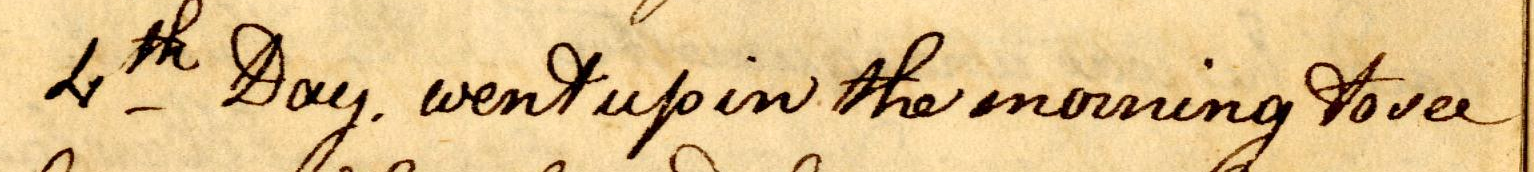4^th Day. went up in the morning to see
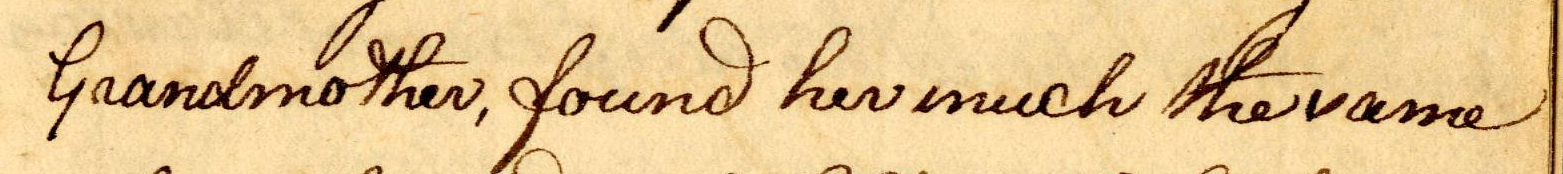Grandmother, found her much the same
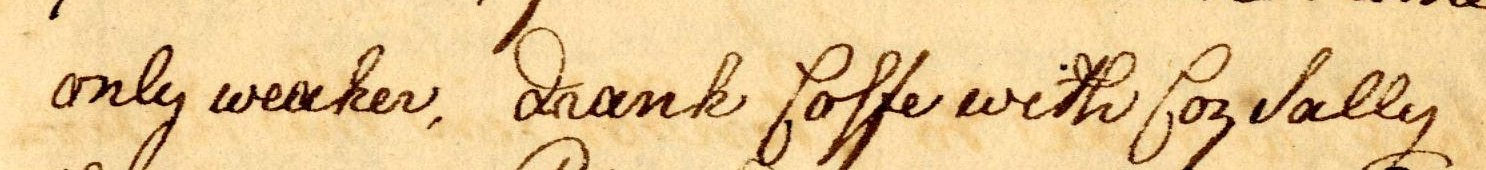only weaker, drank Coffe with Coz Sally
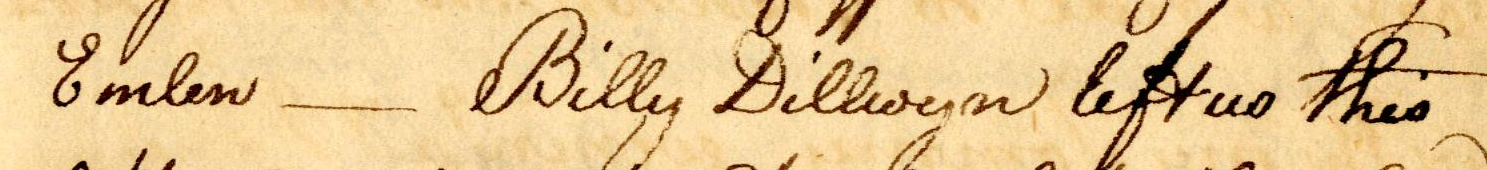Emlen- Billy Dillwyn left us this
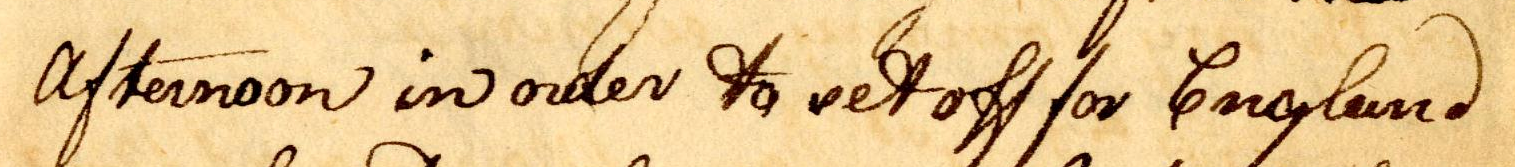Afternoon in order to set off for England
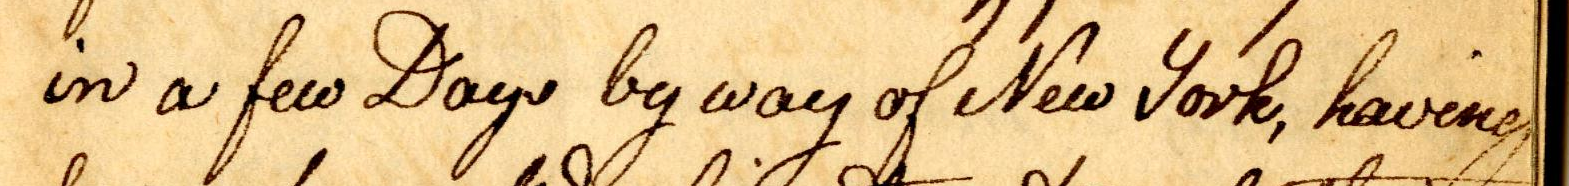in a few Days by way of New York, having
